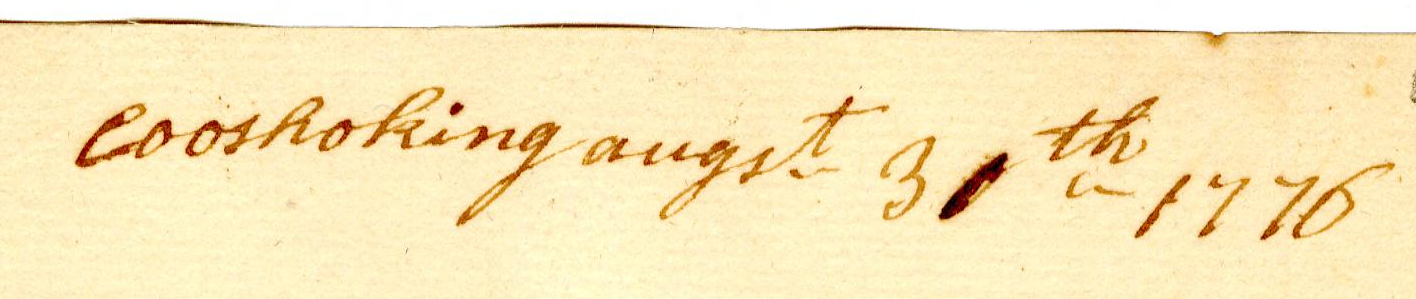cooshoking augs^t 30^th. 1776
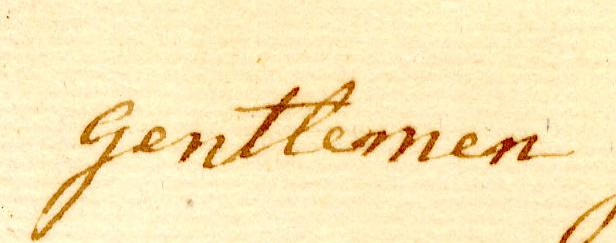gentlemen
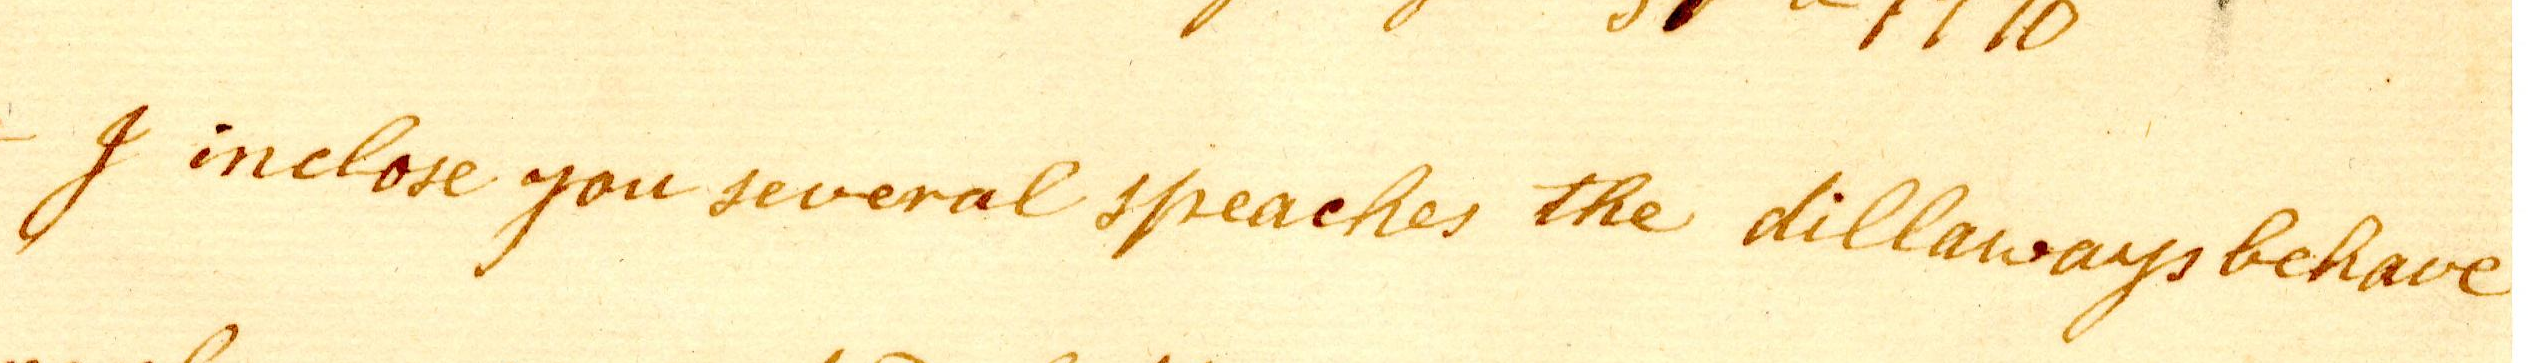I inclose you several speaches the dillaways behave
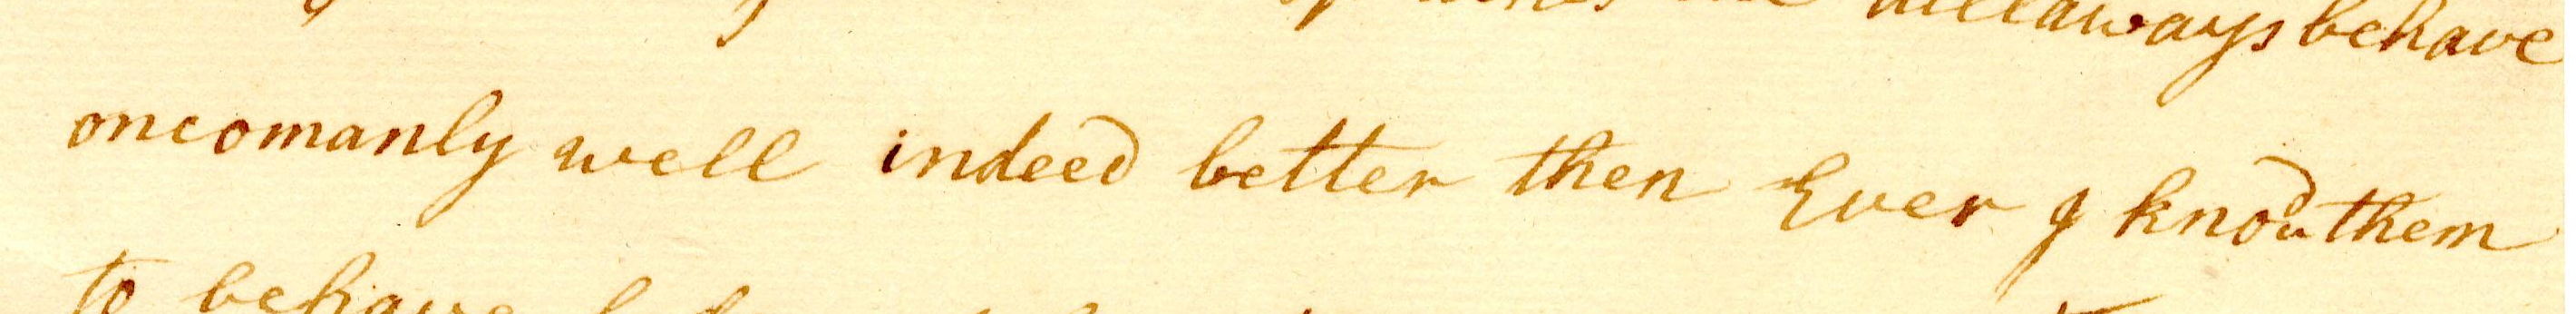oncomanly well indeed better then Ever I kno^d them
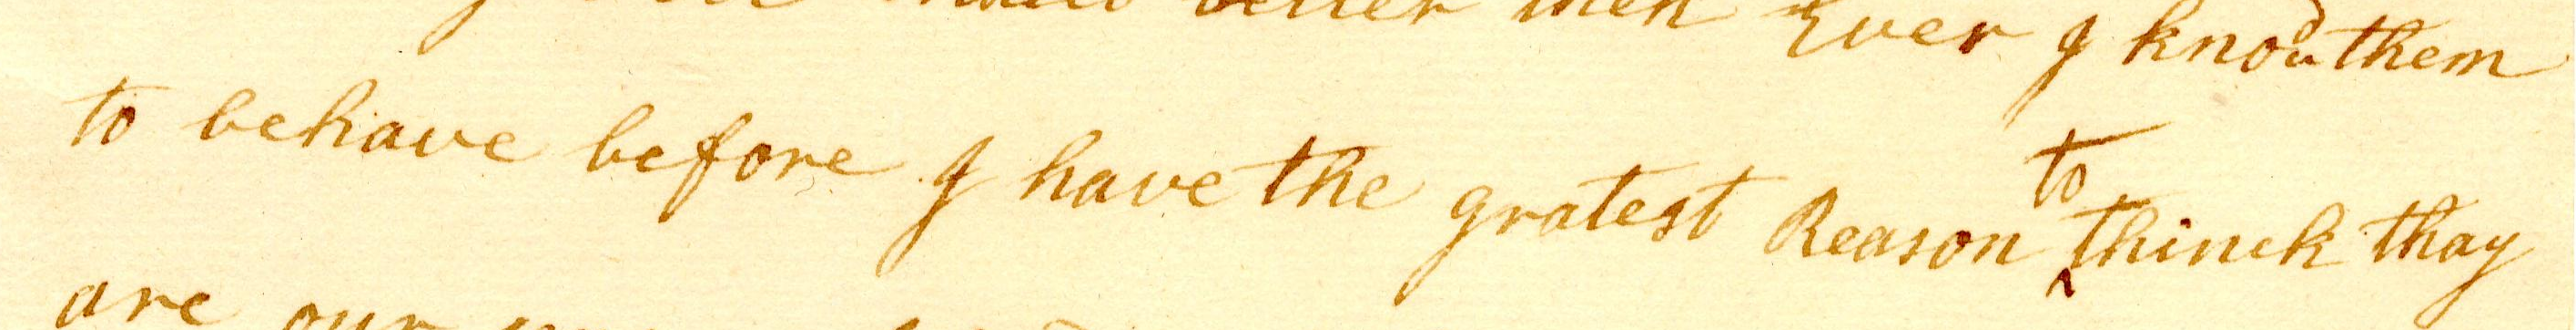to behave before I have the gratest Reason ^to thinck thay
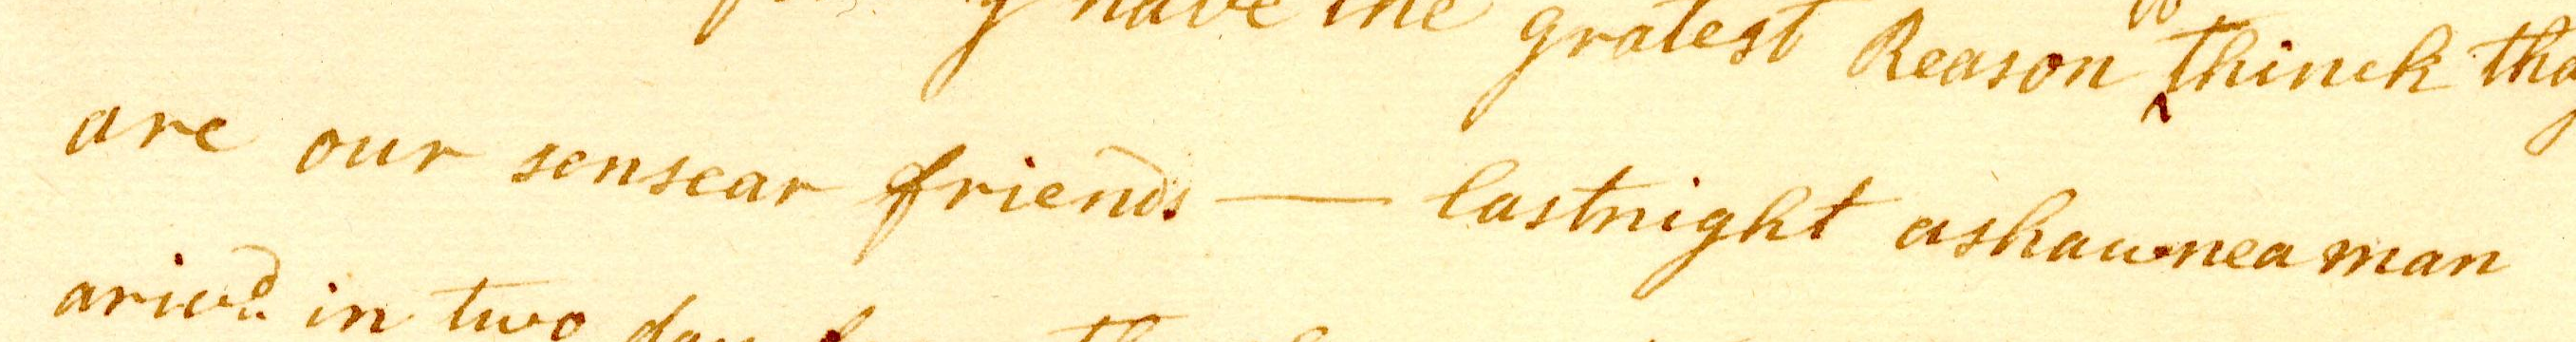are our sensear friends.- lastnight ashawnea man
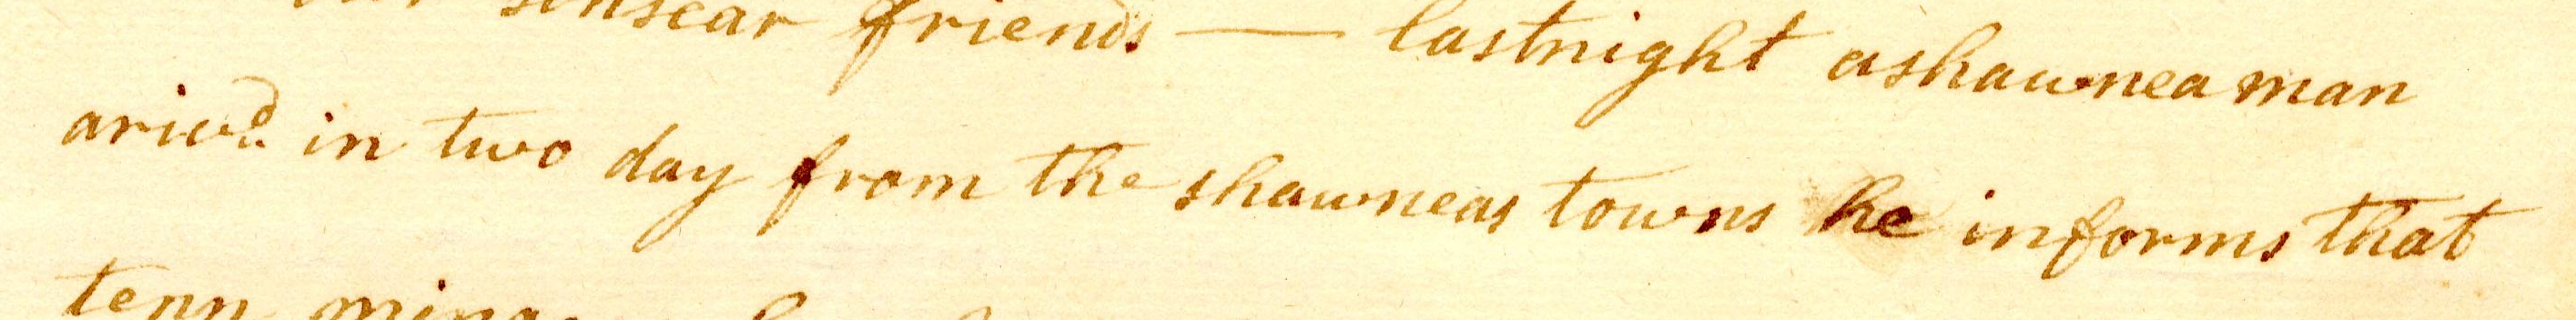ariv^d in two day from the shawneas towns he informs that
